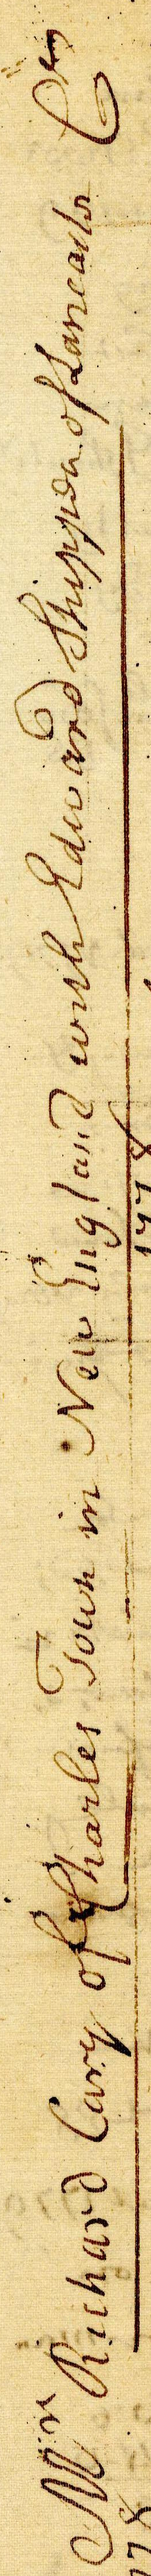M^r Richard Cary of Charles Town in New England with Edward Shippen of Lancaster C^opy
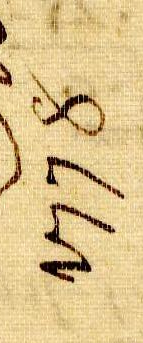1778
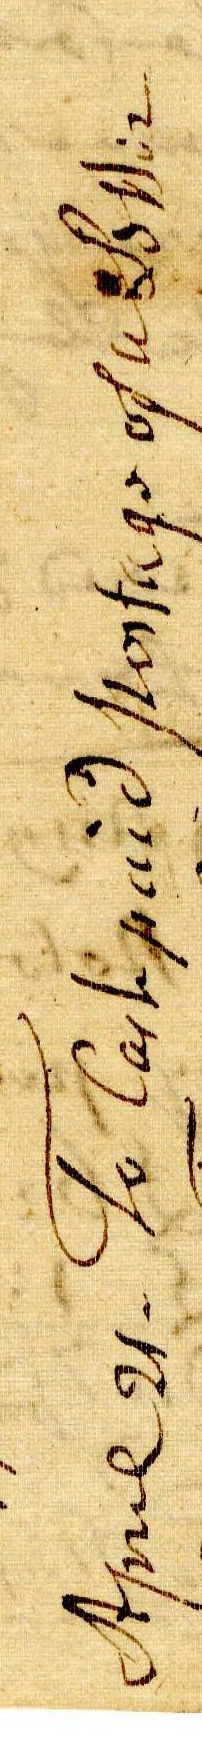April 21- To Cash paid postage of a Letter
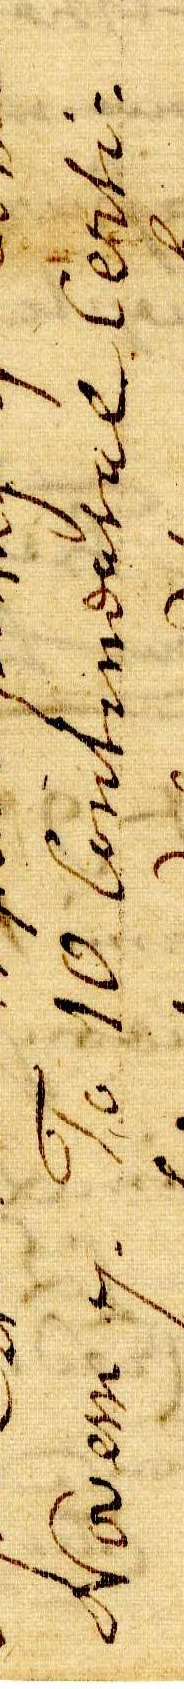Novem 7. To 10 Continental Certi-
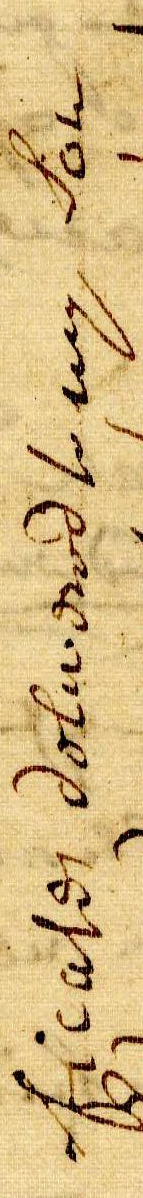-ficates delivered to my Son
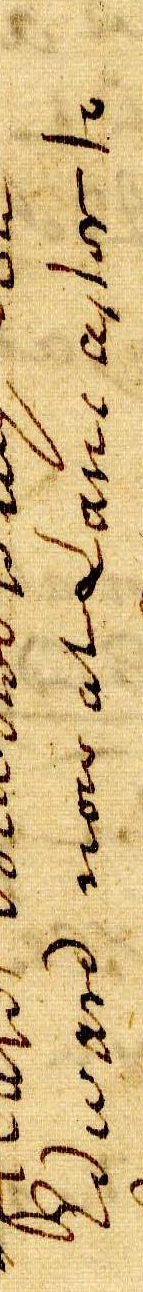Edward now at Lancaster to
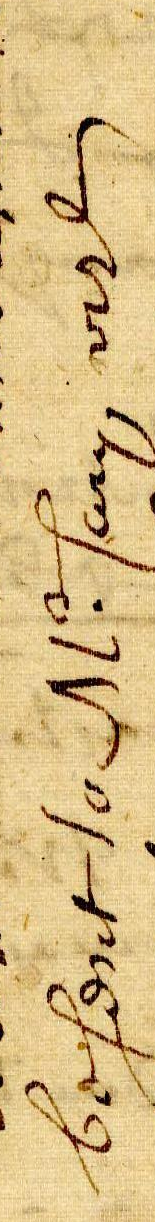be sent to M^r. Cary viz^t
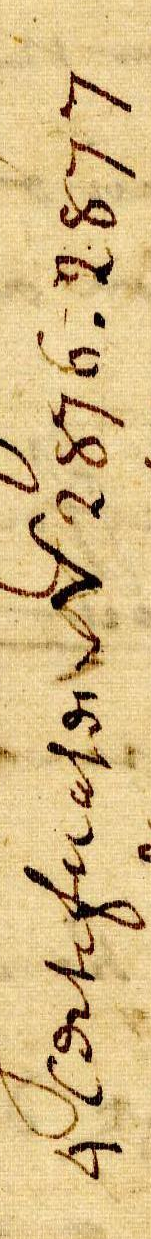4 Certificates N 2876. 2877
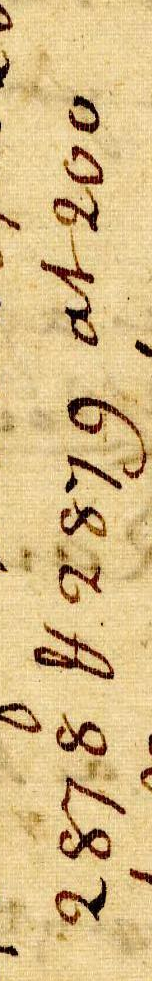2878 & 2879 at 200
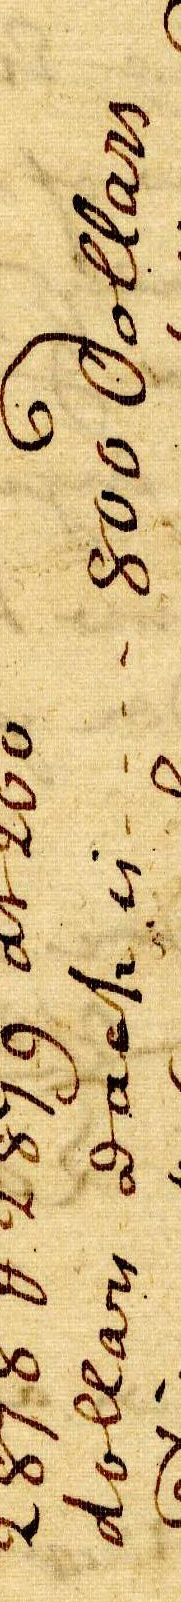dollars back is ---- 800 dollars
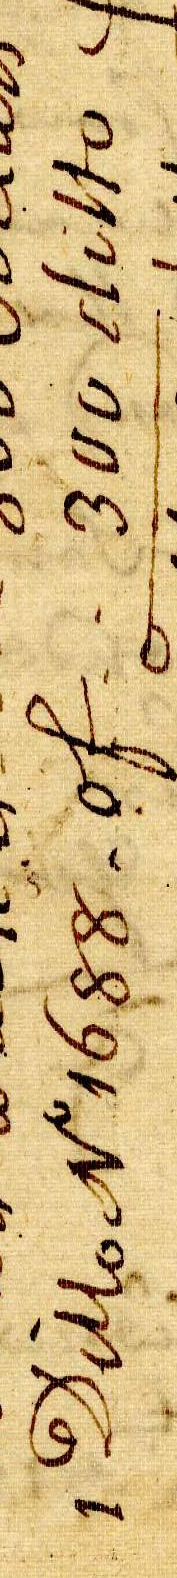1 Ditto N^o-1688 of.. 300 ditto
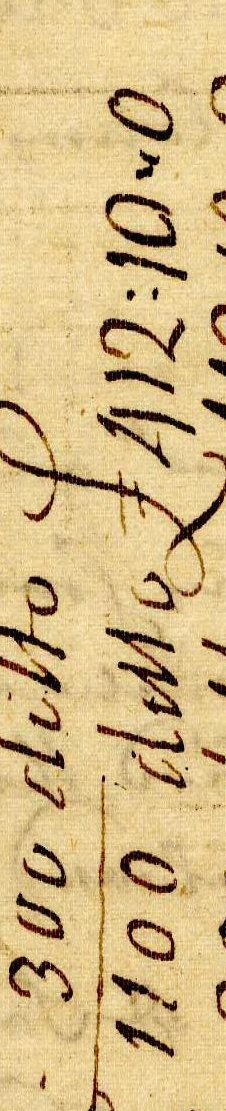1100 ditto £412:10..0
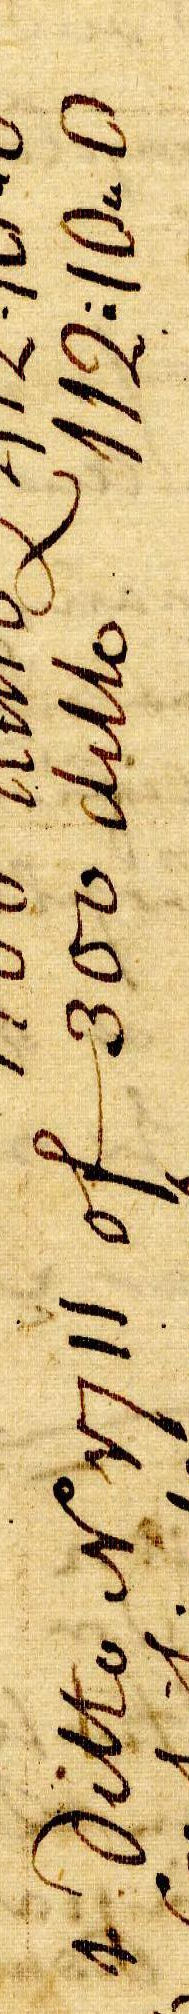+ditto N 1711 of 300 ditto 112:10..0
